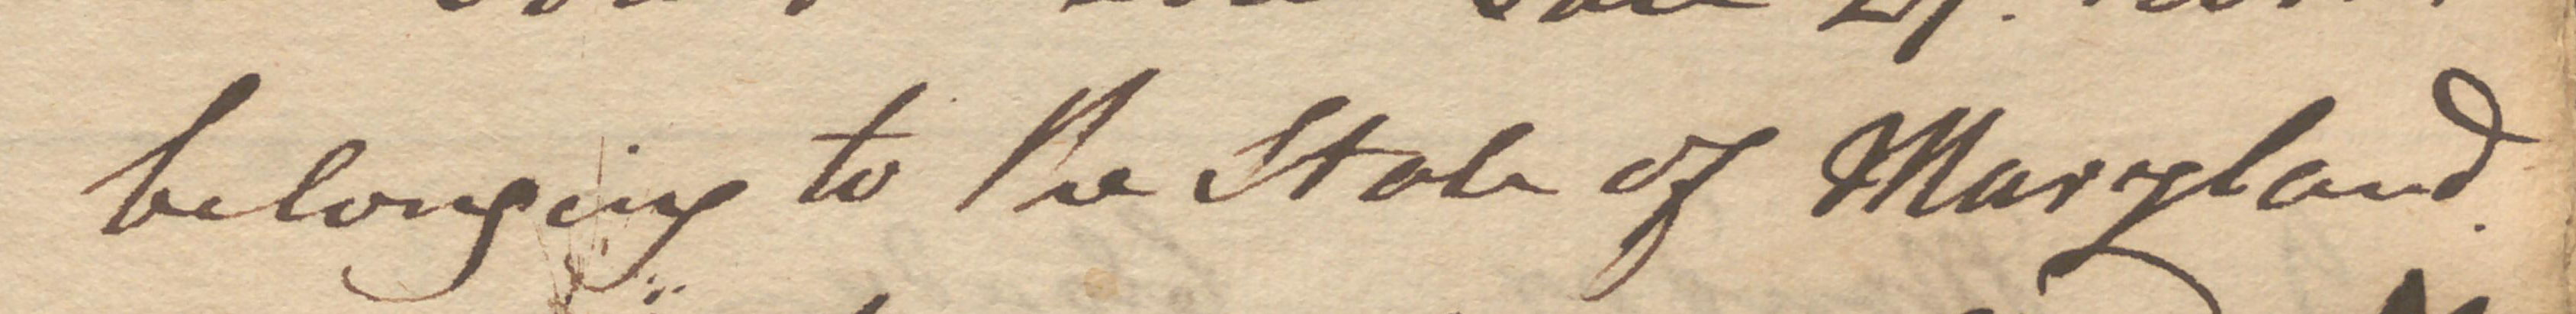belonging to the State of Maryland
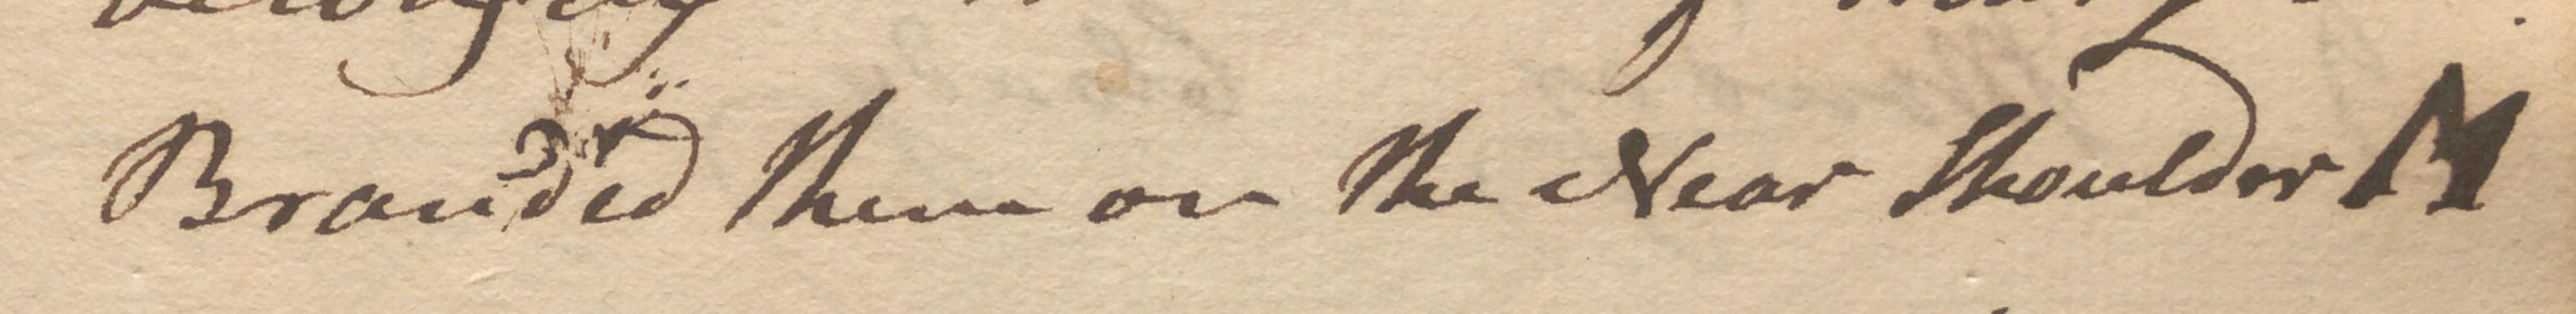Branded them on the Near Shoulder M
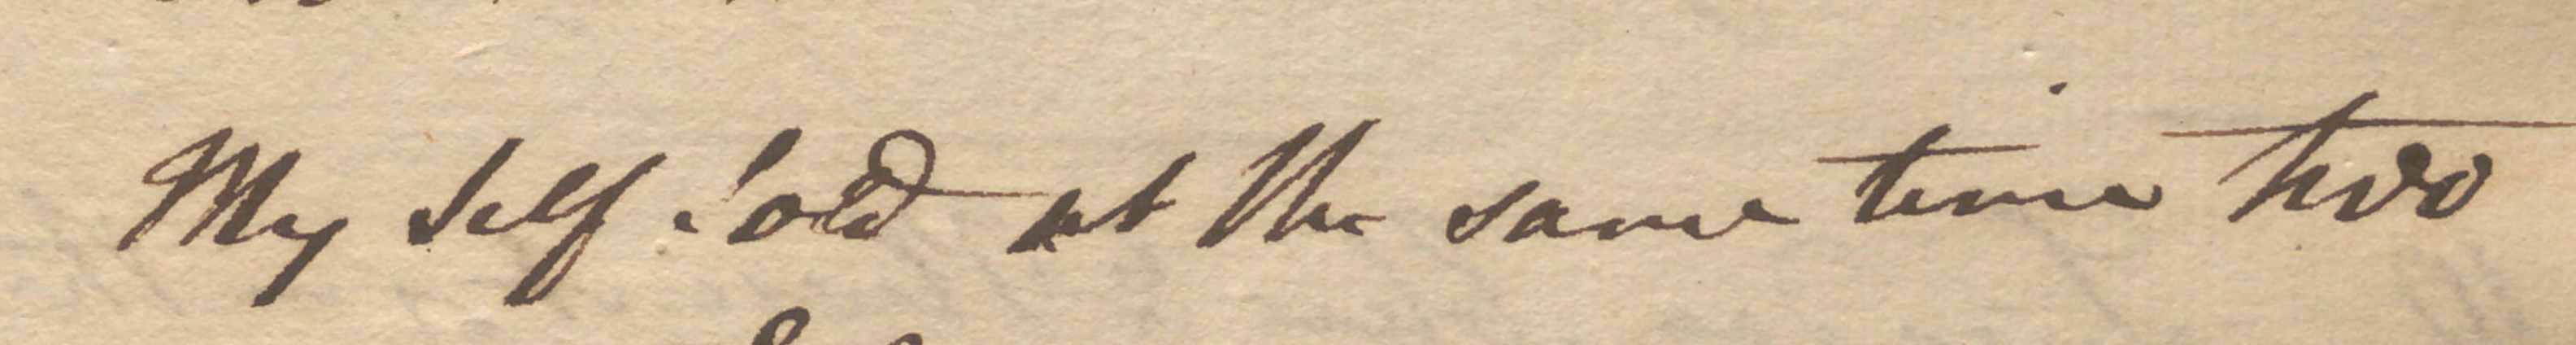My self sold at the same time two
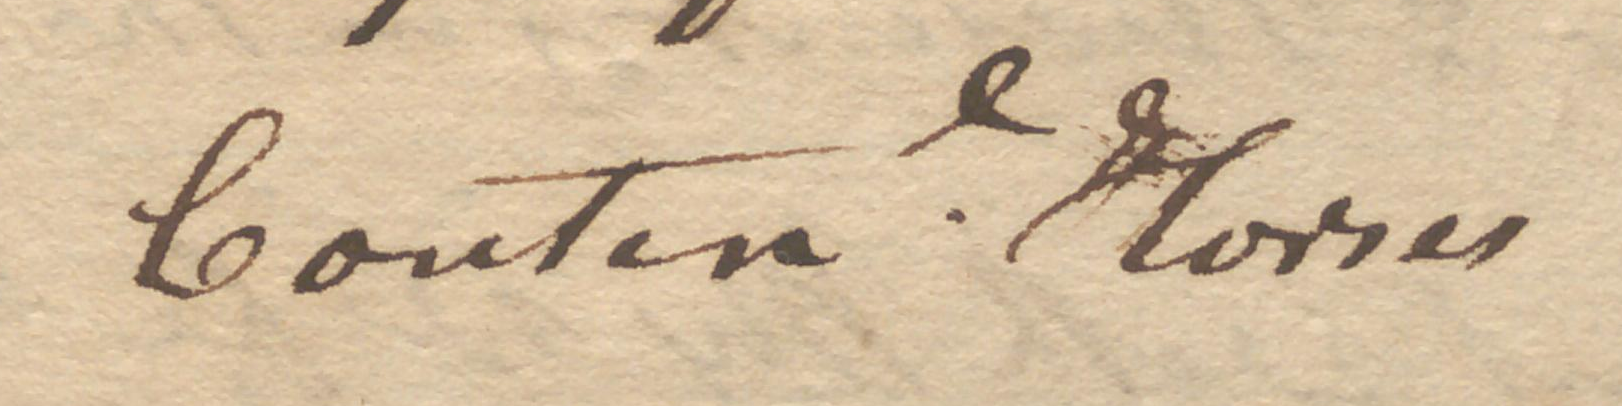Contin^l. Horses
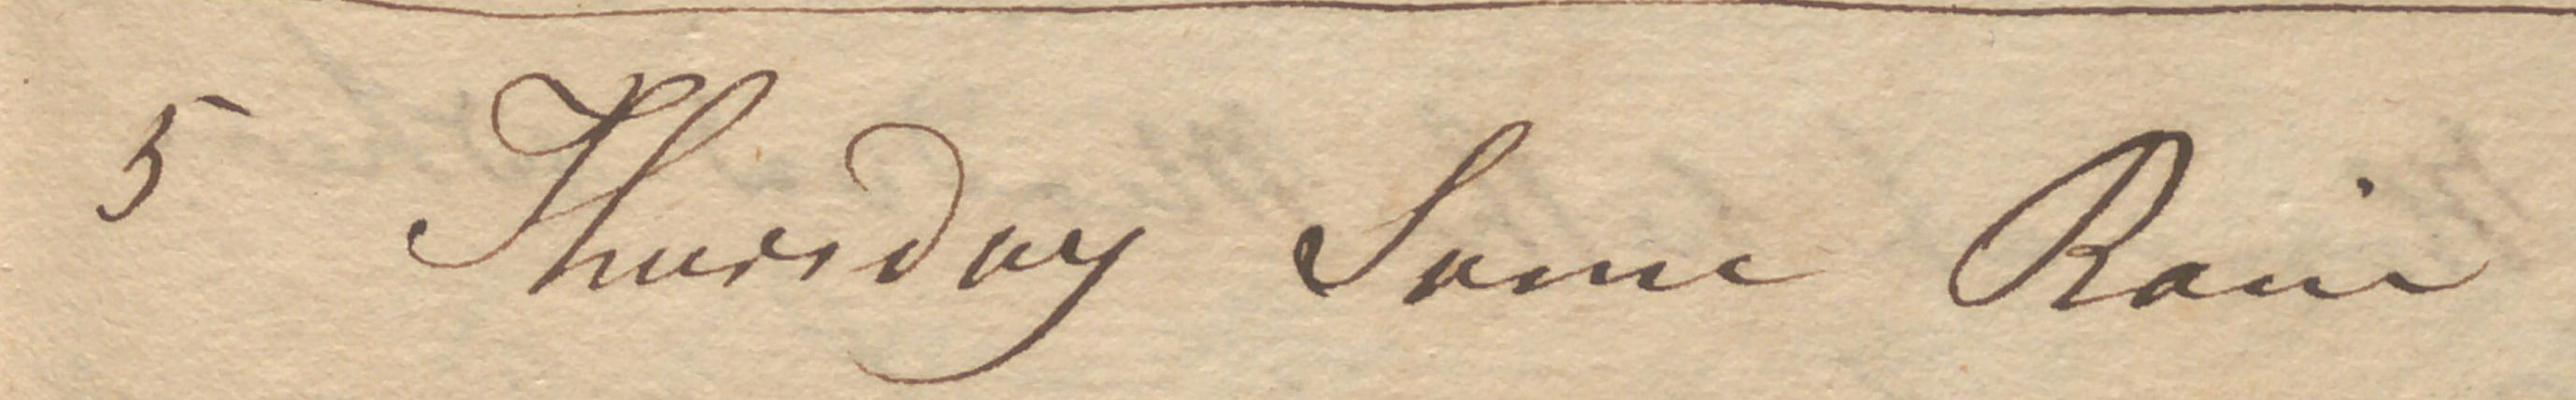Thursday Some Rain
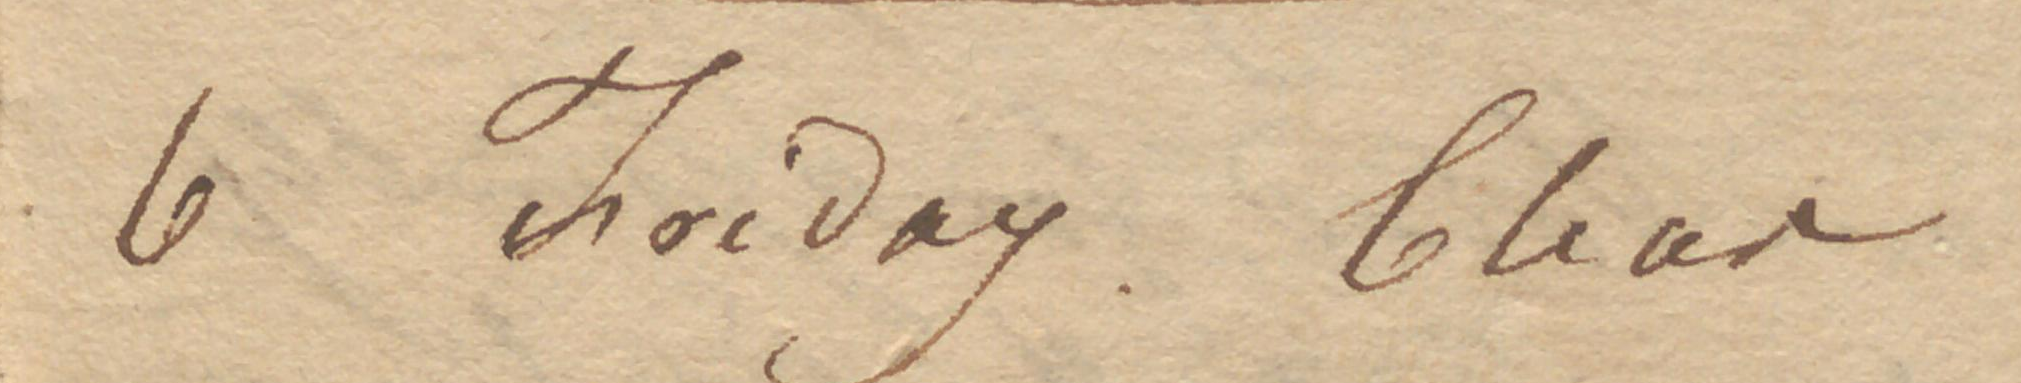6 Friday Clear
